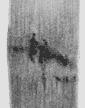十一
